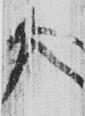大
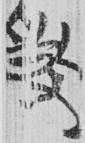事
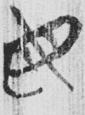母
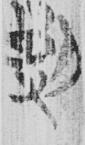○（殘）
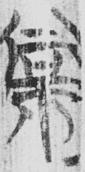○（常）
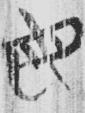母
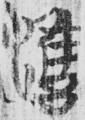雍
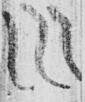川
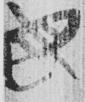母
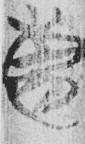○（斷）
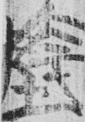陓（洿）
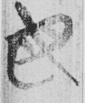母
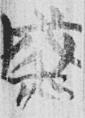○（滅）
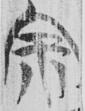宗
